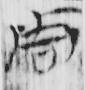周
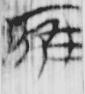雁
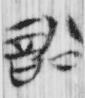訟
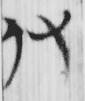付
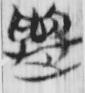○（舉）
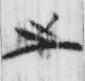之
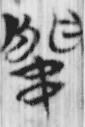○（關）
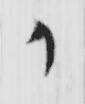人
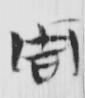周
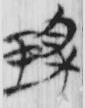○（瑶）
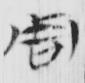周
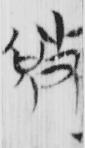敓
